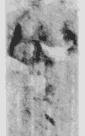心
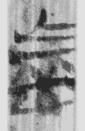𢝬
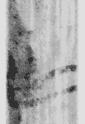亡
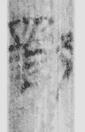{單犬}
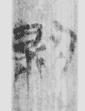則
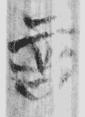言
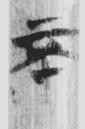不
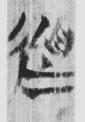道
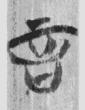言
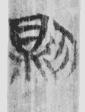則
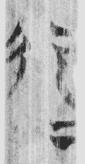行=
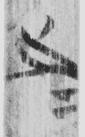之=
